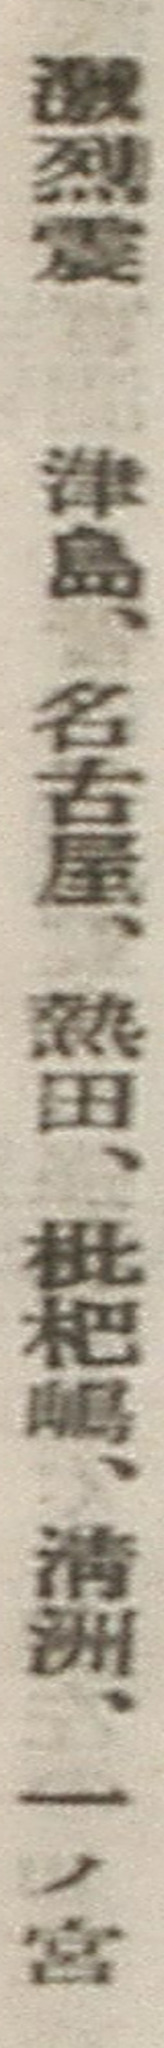激烈震津島、名古屋、熱田、枇杷嶋、清洲、一ノ宮
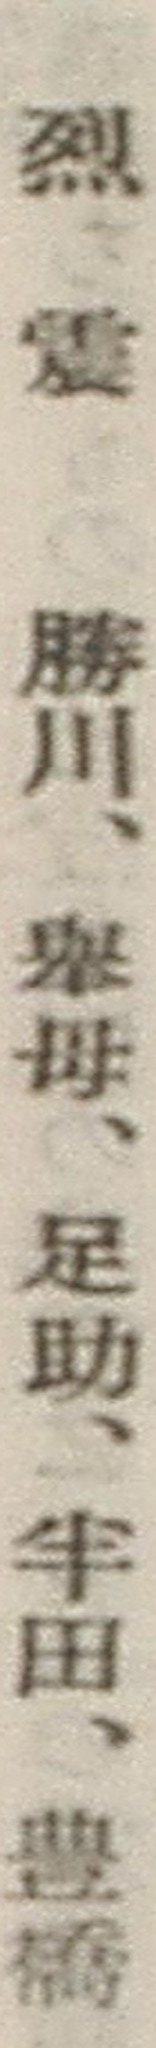烈震勝川、挙母、足助、半田、豊橋
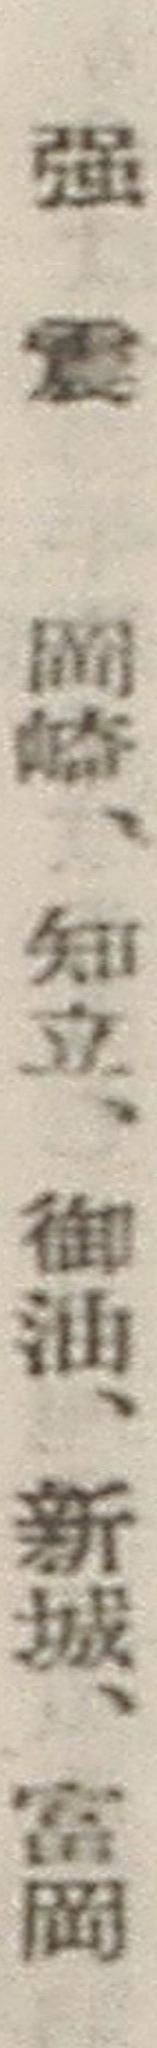強震岡崎、知立、御油、新城、富岡

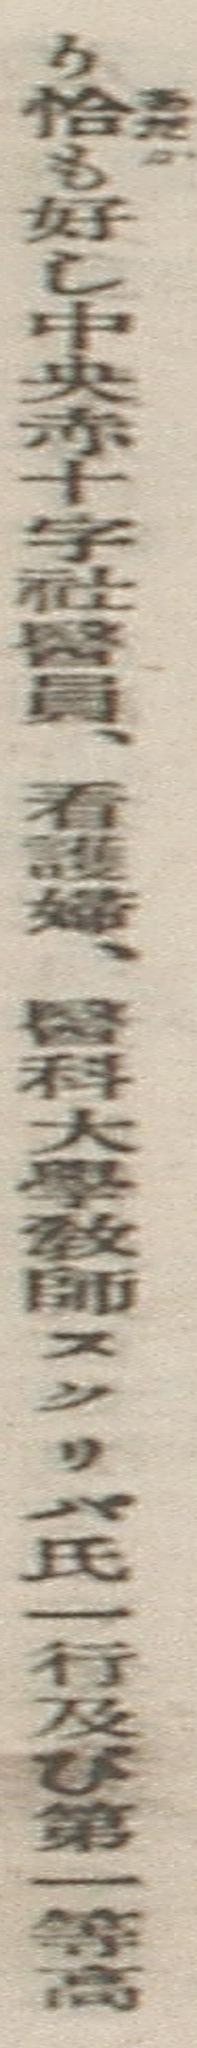り恰あたかも好し中央赤十字社医員、看護婦、医科大学教師スクリバ氏一行及び第一等高

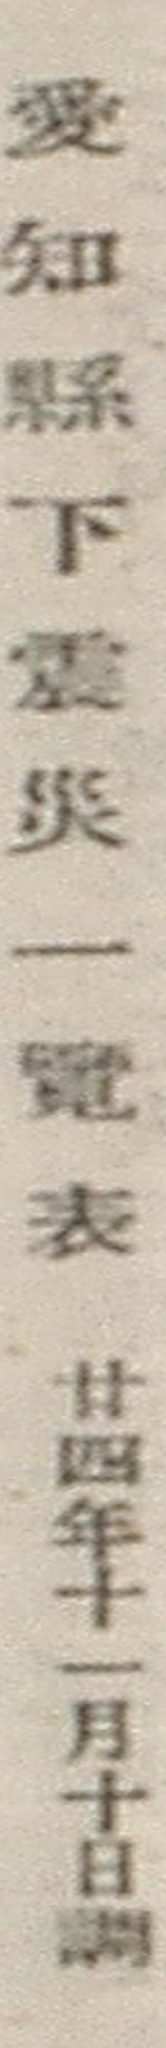愛知県か震災一覧表廿四年十一月十日調
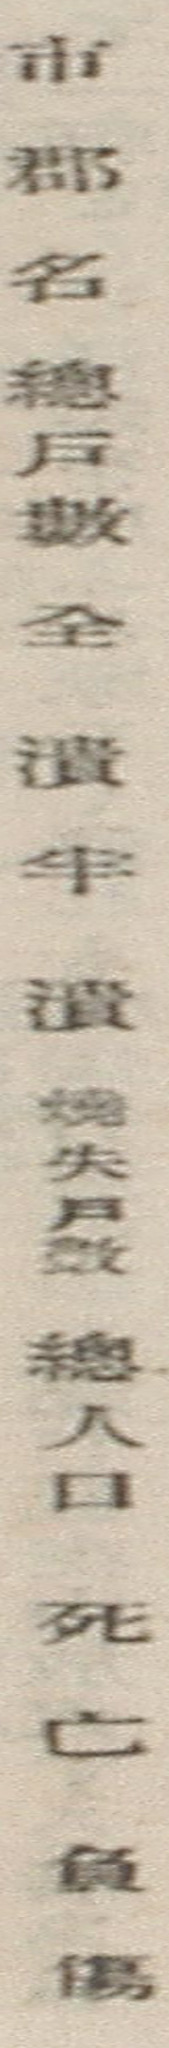市郡名総戸数全潰半潰焼失戸数総人口死亡負傷
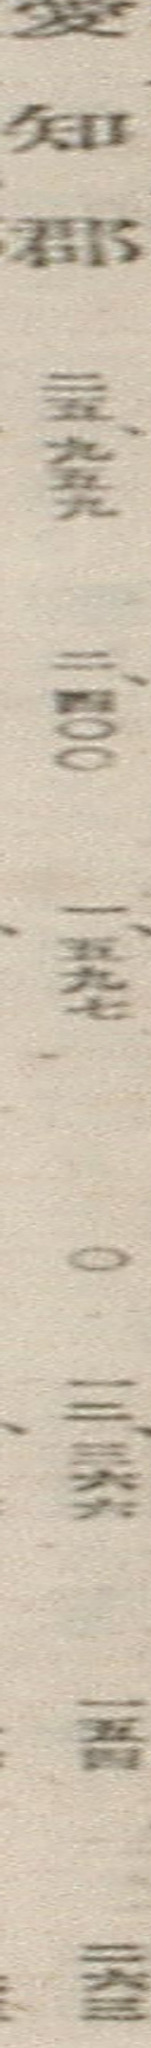愛知郡二五、九五九ニ、四〇〇一、五九七〇一二、三六六一五四二六三
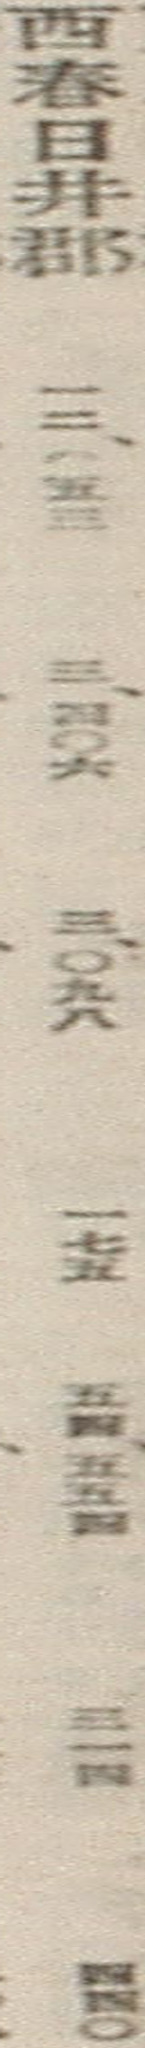西春日井郡一二、〇五三三、四〇六三、〇九八一七五五四、五五四三一四四四〇
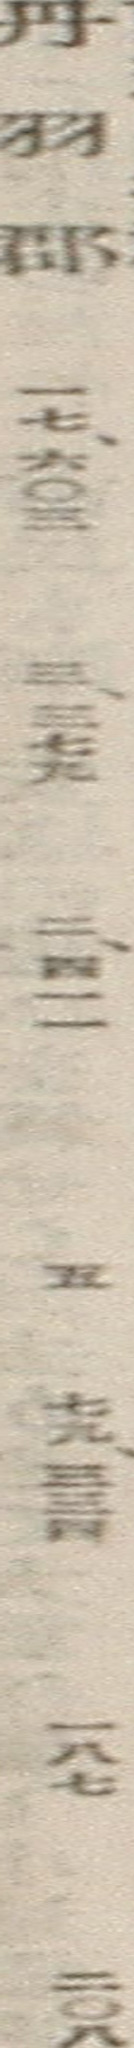丹羽郡一七、六〇三三、三七九二、四一一五七九、三三四一八七二〇八

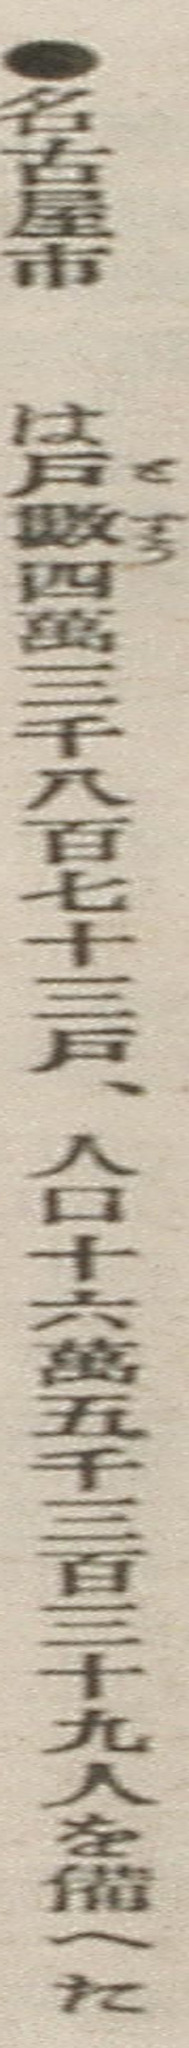●名古屋市は戸数とすう四万三千八百七十三戸、人口十六万五千三百三十九人を備へた
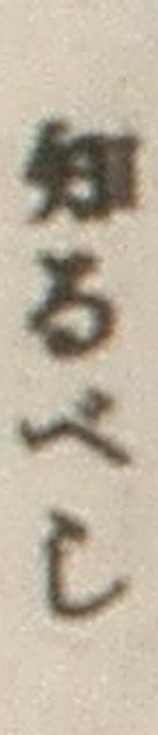知るべし

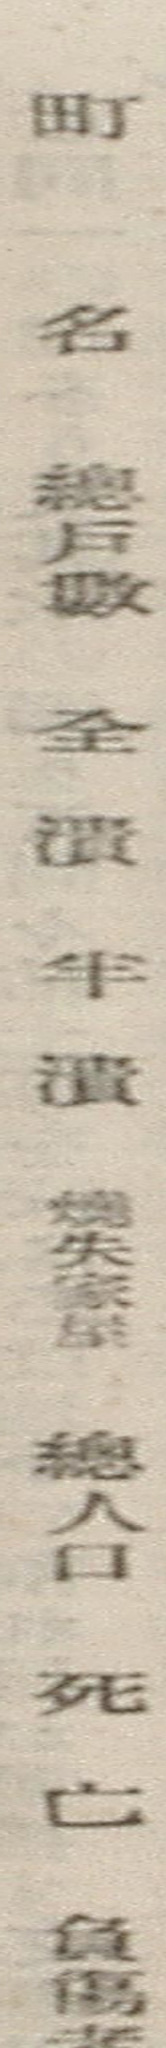町名総戸数全潰半潰焼失家屋総人口死亡負傷者
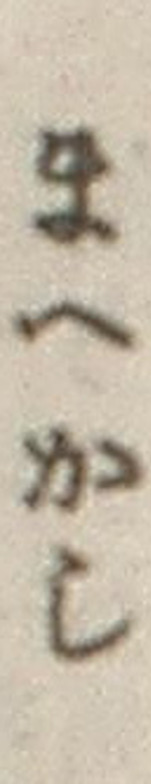まへかし

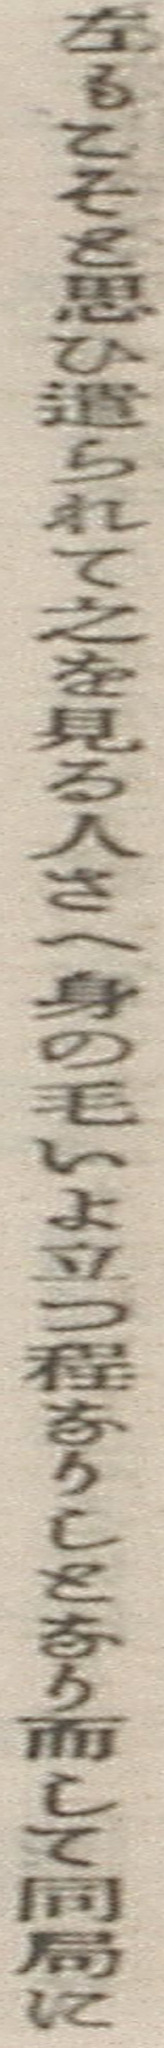左もこそと思ひ遣られて之を見る人さへ身の毛いよ立つ程なりしとなり而して同局に
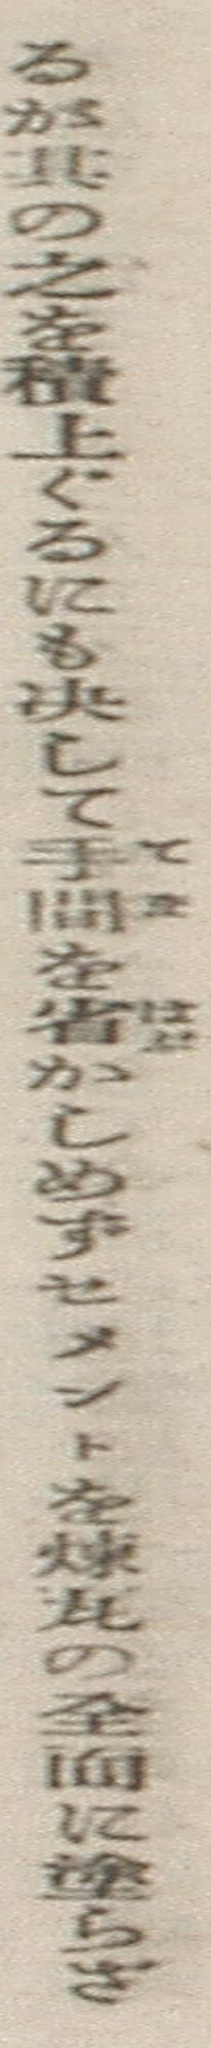るが其の之を積上ぐるにも決して手間てまを省かしめずセメントを煉瓦の全面に塗らざ

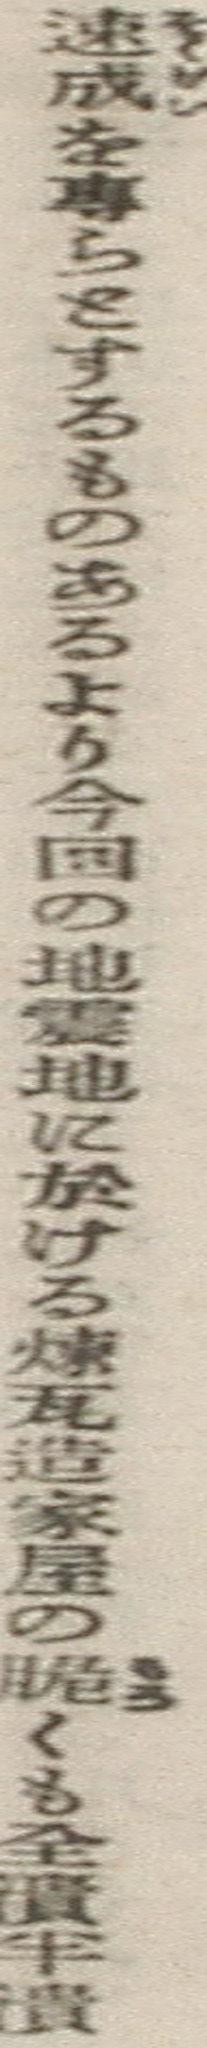速成を専らとするものあるより今回の地震地に於ける煉瓦造家屋の脆くも全潰半潰
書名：愛知岐阜福井三県　大地震見聞録（内題）
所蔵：東京大学地震研究所図書室 Earthquake Research Institute Library, The University of Tokyo, JAPAN
